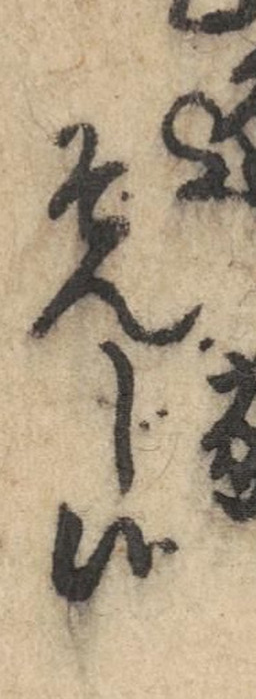そんじ候
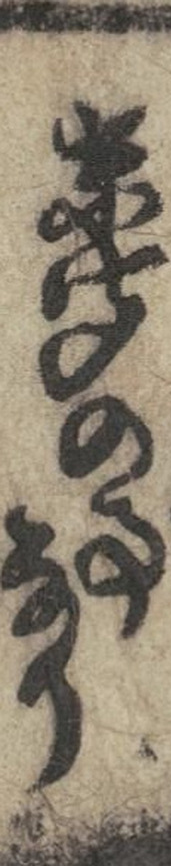未聞の事
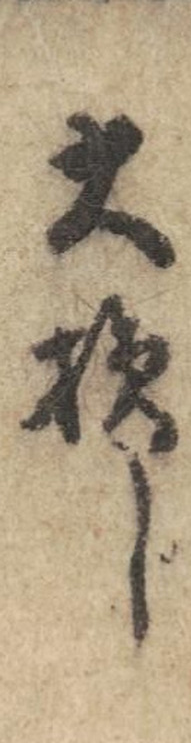大損じ
